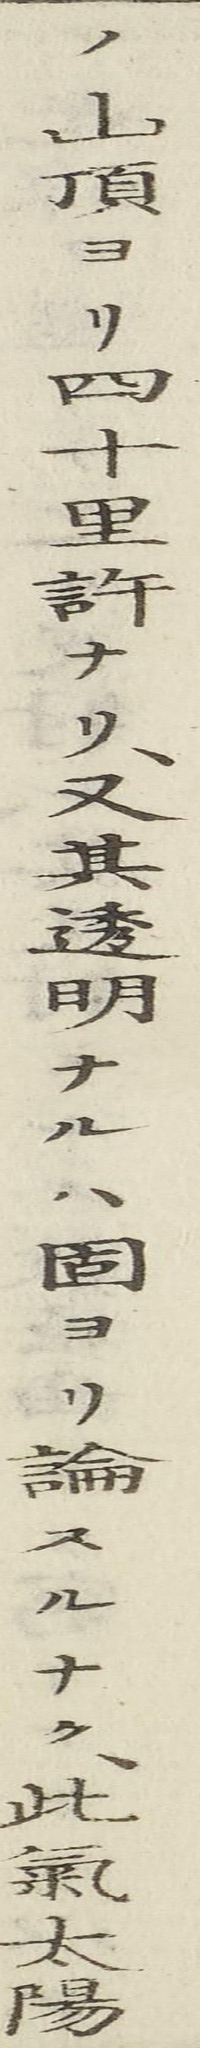ノ山頂ヨリ四十里許ナリ、又其透明ナルハ固ヨリ論スルナク、此気太陽

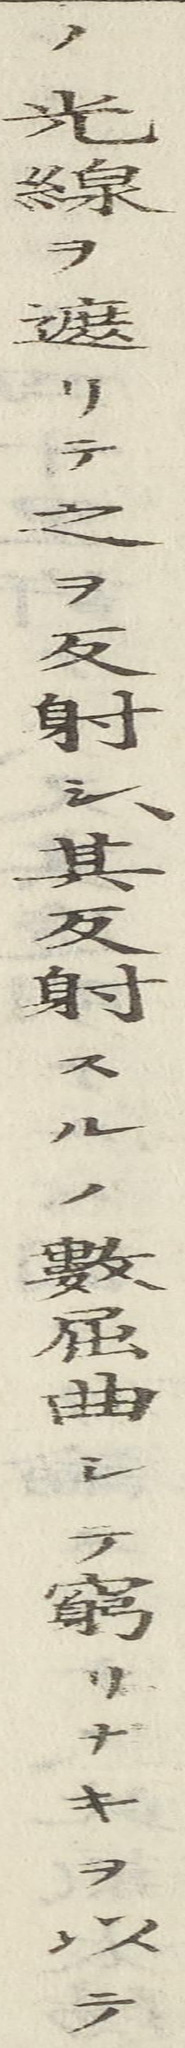ノ光線ヲ遮リテ之ヲ反射シ、其反射スルノ数屈曲シテ窮リナキヲ以テ
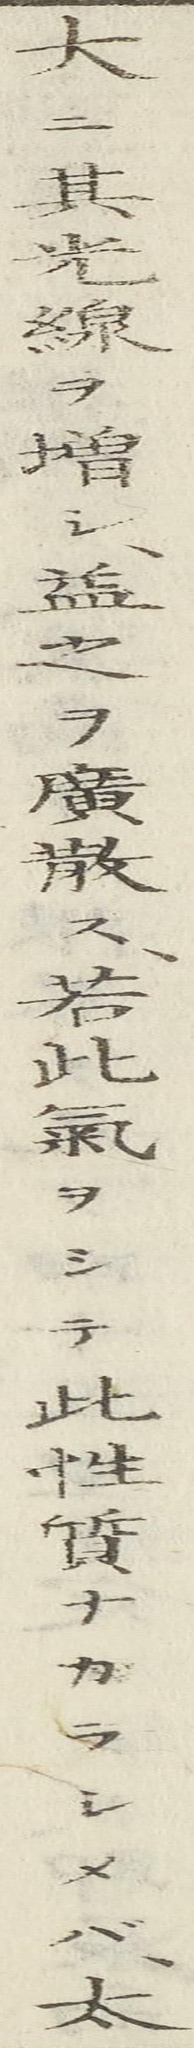大ニ其光線ヲ増シ、益之ヲ広散ス、若此気ヲシテ此性質ナカラシメバ、太
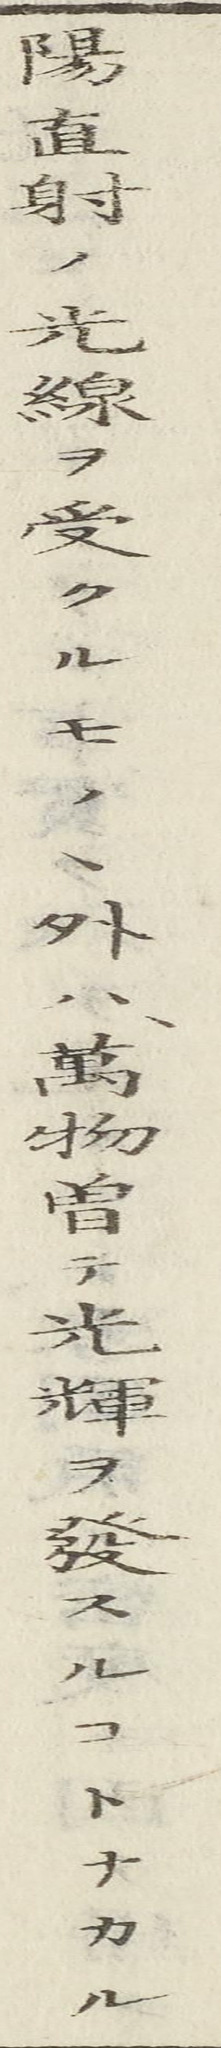陽直射ノ光線ヲ受クルモノヽ外ハ、万物曾テ光輝ヲ発スルコトナカル
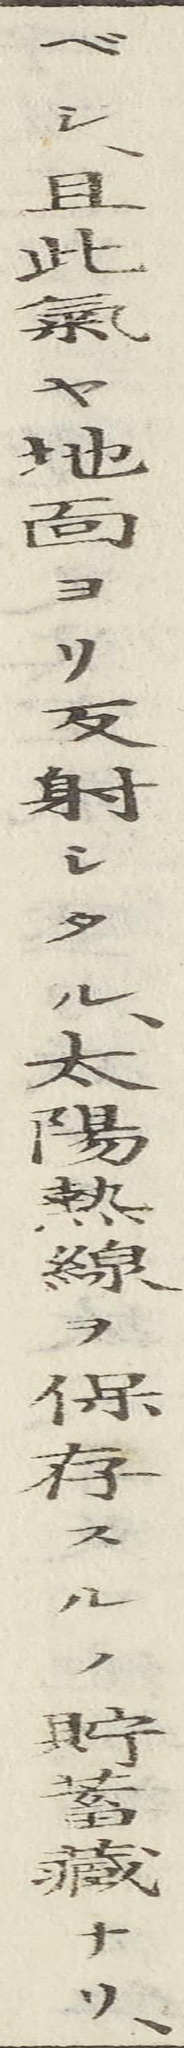ベシ、且此気ヤ地面ヨリ反射シタル、太陽熱線ヲ保存スルノ貯蓄蔵ナリ、
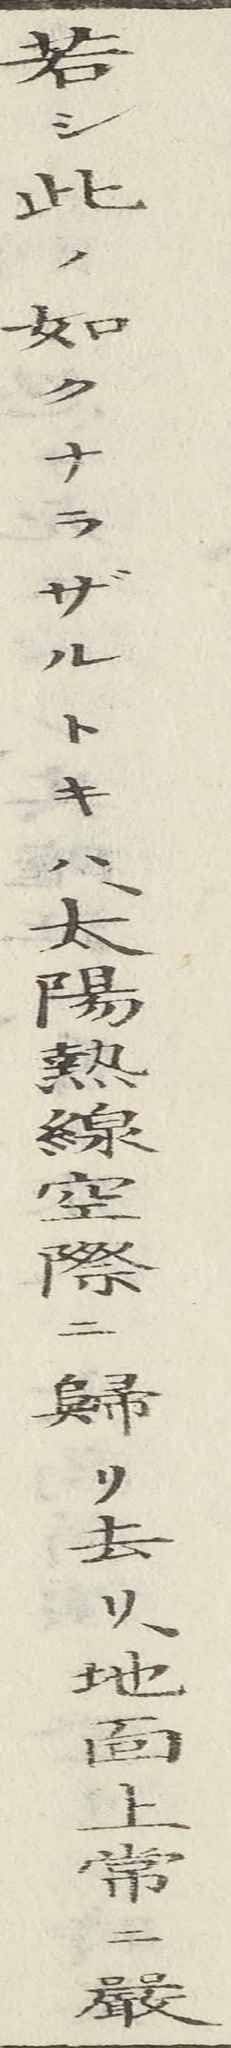若シ此ノ如クナラザルトキハ、太陽熱線空際ニ帰リ去リ、地面上常ニ厳
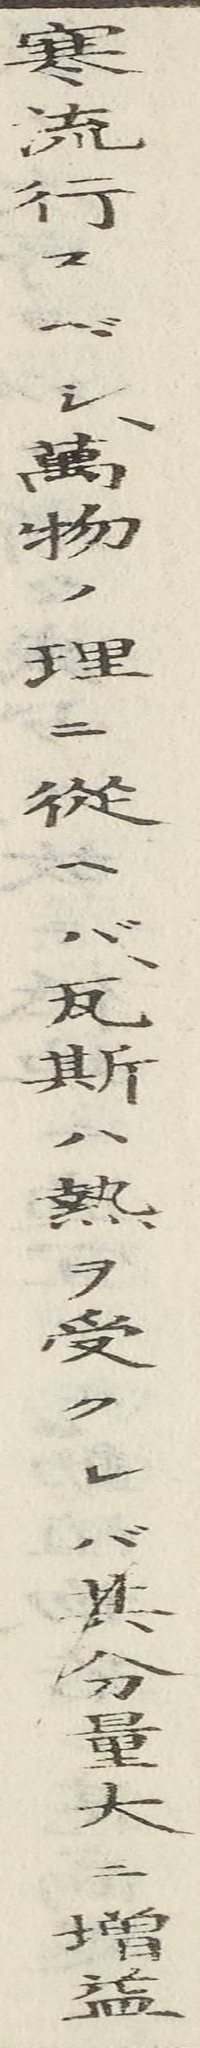寒流行スベシ、万物ノ理ニ従ヘバ、瓦斯ハ熱ヲ受クレバ其分量大ニ増益
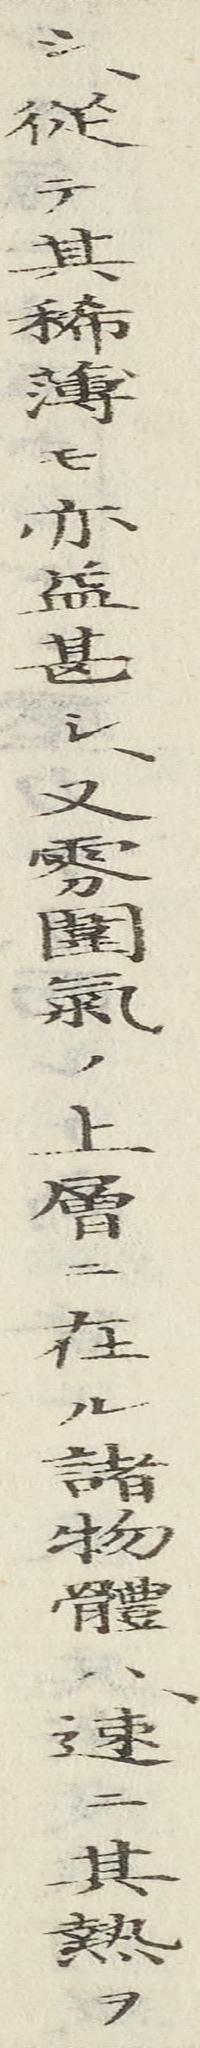シ、従テ其稀薄モ亦益甚シ、又雰囲気ノ上層ニ在ル諸物体ハ、速ニ其熱ヲ
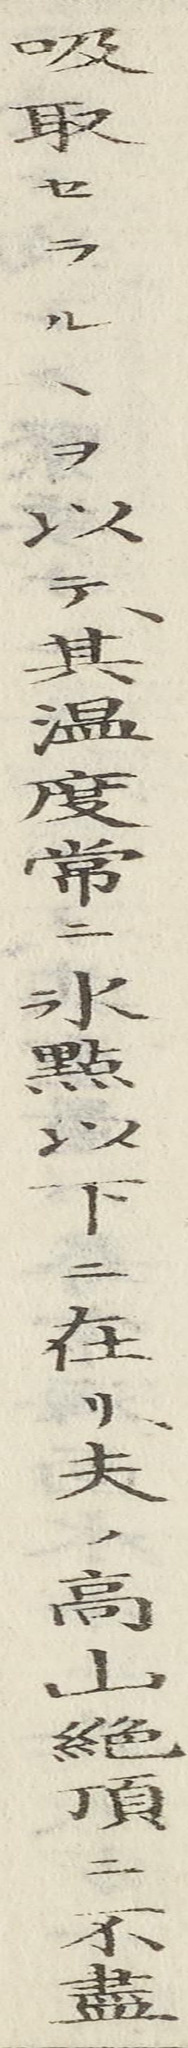吸取セラルヽヲ以テ、其温度常ニ氷点以下ニ在リ、夫ノ高山絶頂ニ不尽
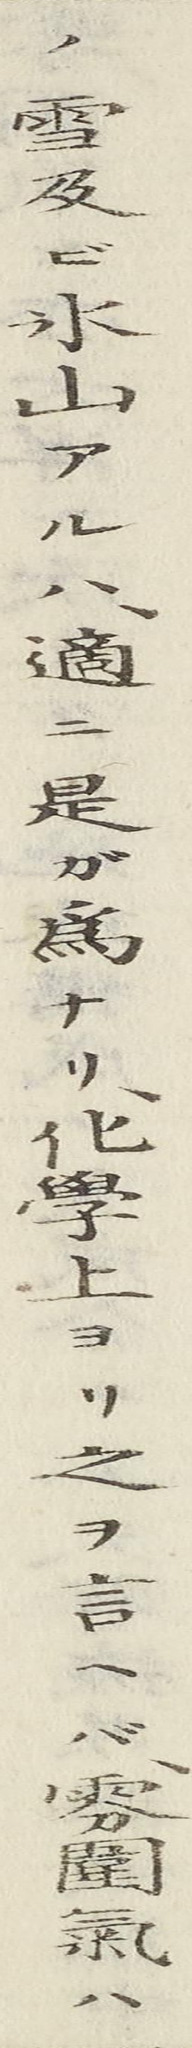ノ雪及ビ氷山アルハ、適ニ是ガ為ナリ、化学上ヨリ之ヲ言ヘバ、雰囲気ハ
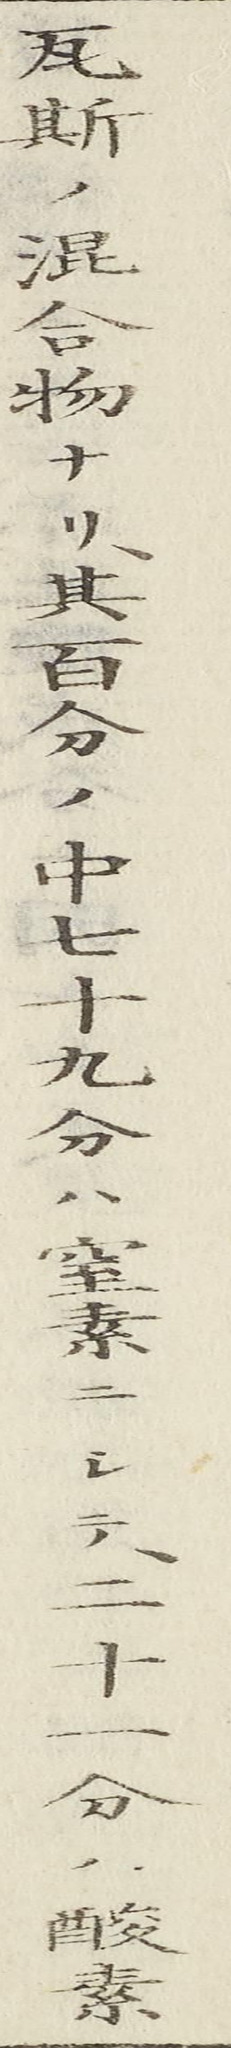瓦斯ノ混合物ナリ、其百分ノ中七十九分ハ窒素ニシテ、二十一分ハ酸素
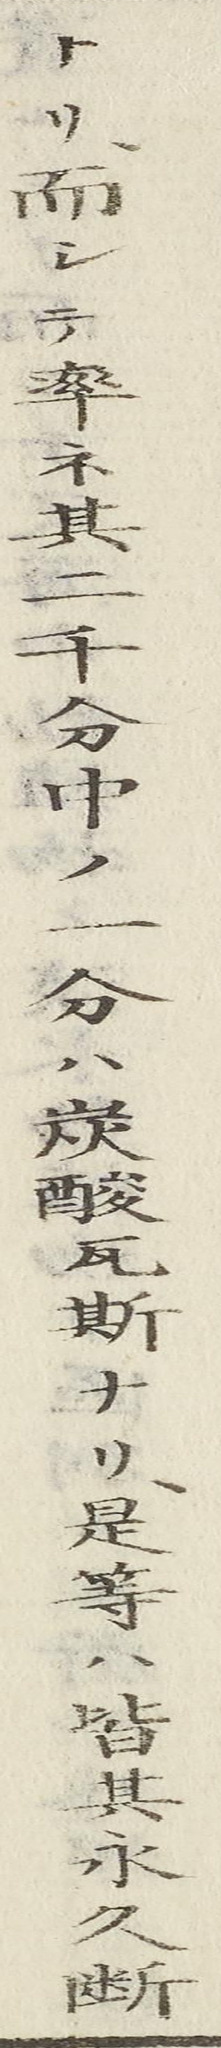ナリ、而シテ率ネ其ニ千分中ノ一分ハ炭酸瓦斯ナリ、是等ハ皆其永久断
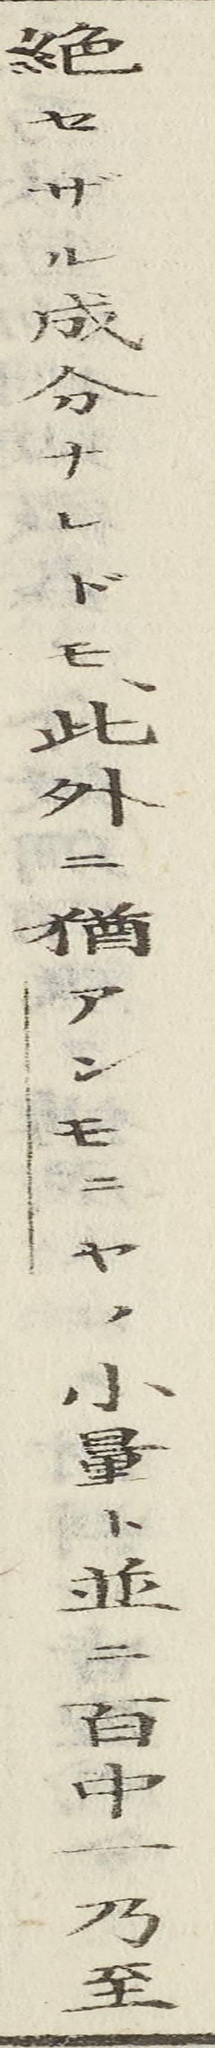絶セザル成分ナレドモ、此外ニ猶アンモニヤノ小量ト並ニ百中一乃至
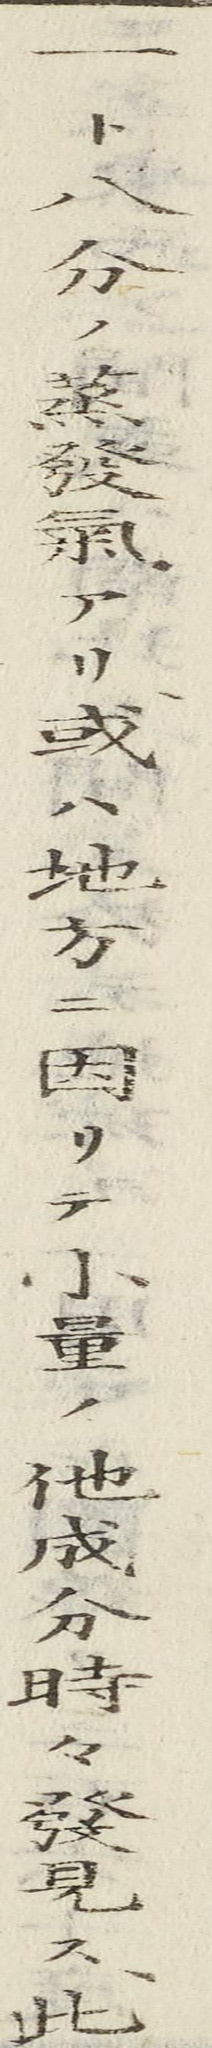一ト八分ノ蒸発気アリ、或ハ地方ニ因リテ小量ノ他成分時々発見ス、此
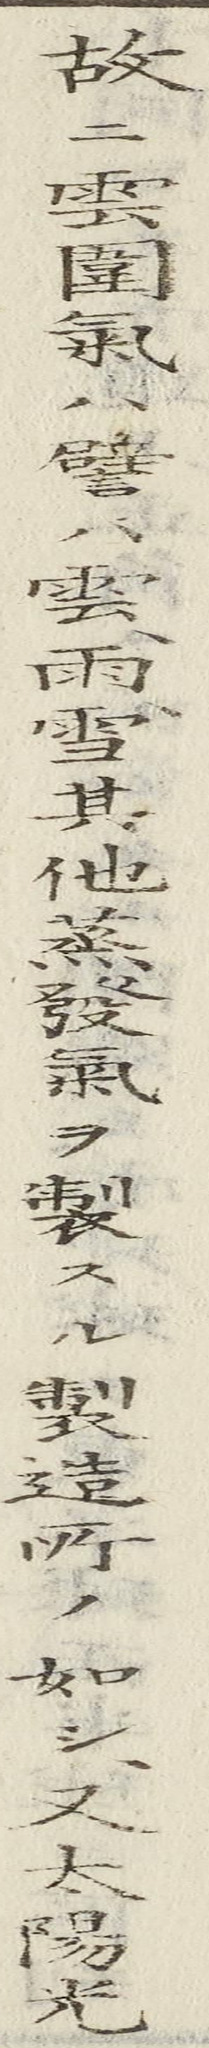故ニ雲囲気ハ譬ハ雲、雨、雪其他蒸発気ヲ製スル製造所ノ如シ、又太陽光
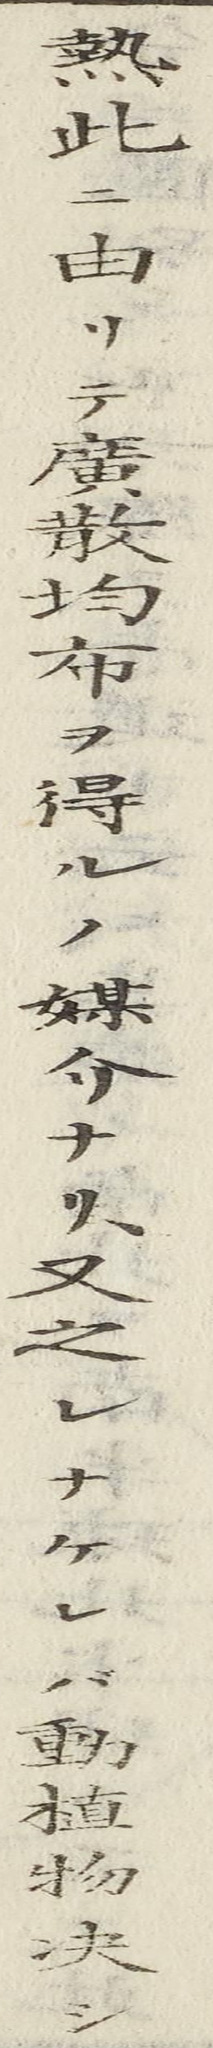熱此ニ由リテ広散均布ヲ得ルノ媒介ナリ、又之レナケレバ動植物決シ
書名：百科全書　地文學　全
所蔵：東京大学地震研究所図書室 Earthquake Research Institute Library, The University of Tokyo, JAPAN
